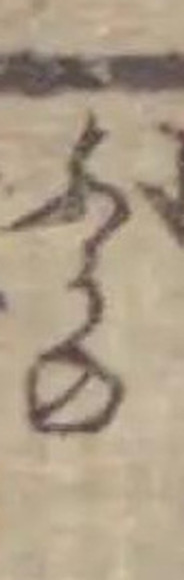ふうの
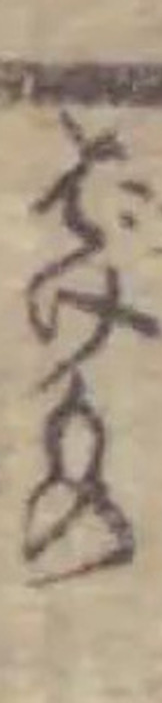ばけもの
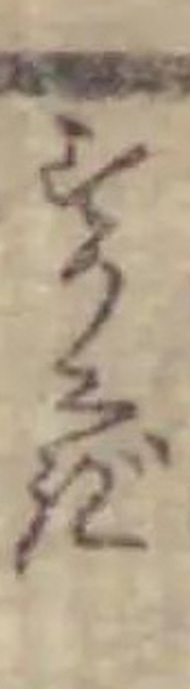すりこぎ
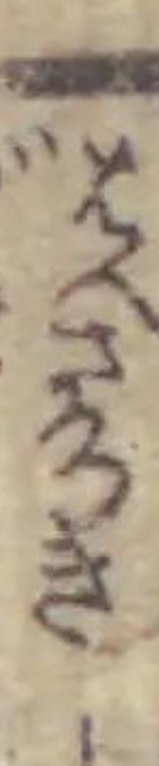はへさかつき
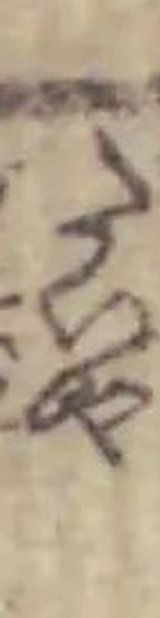だいや
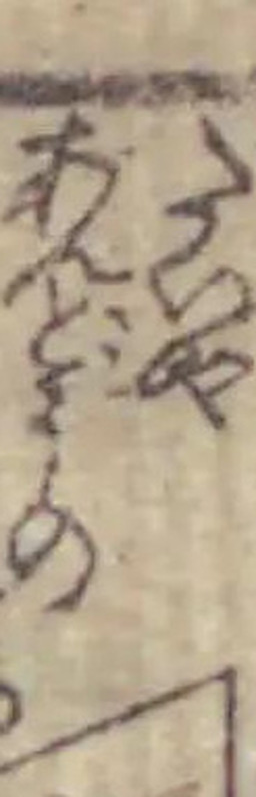あんどうの
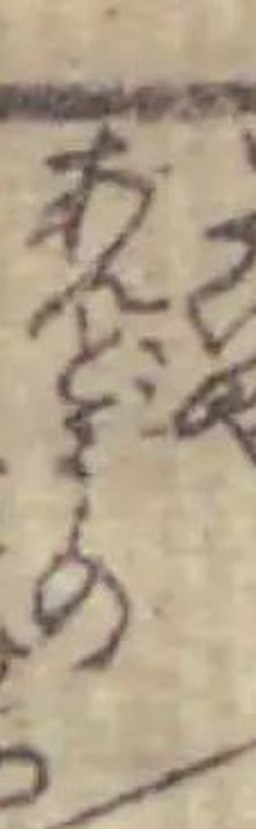あんどうの
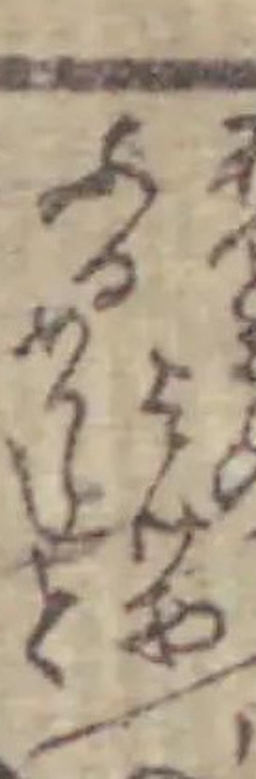ふるめかしと
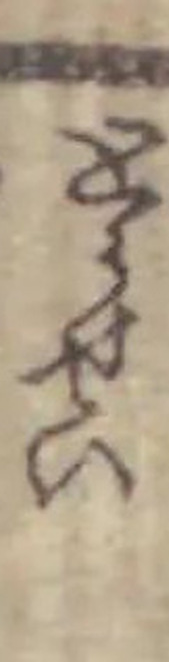とうせい
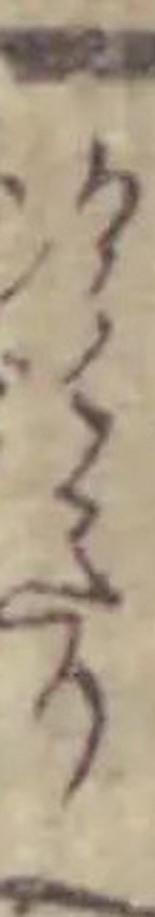からわたり
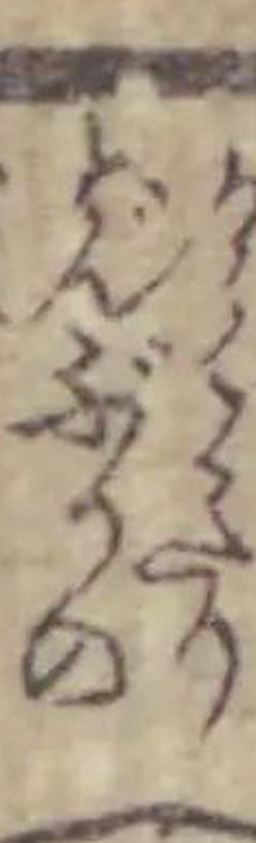どんぶりの
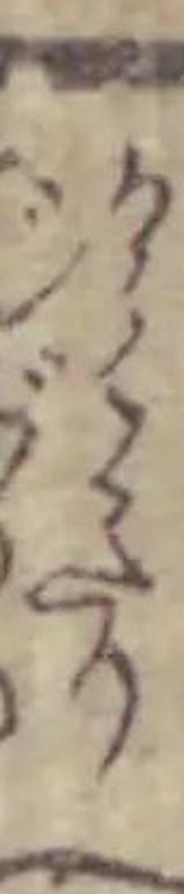からわたり
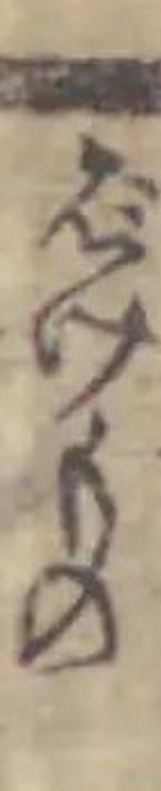ばけもの
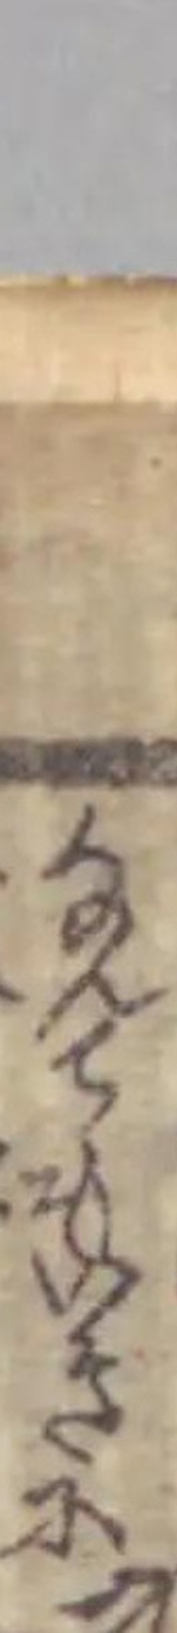なんてもいきに
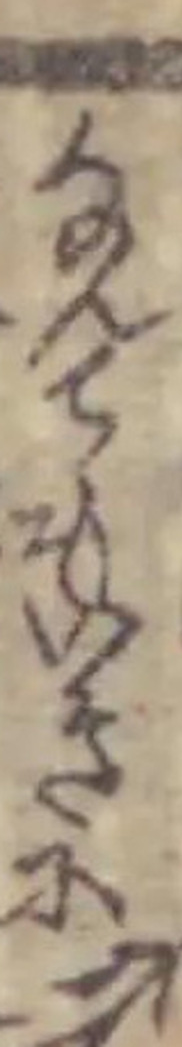なんてもいきに
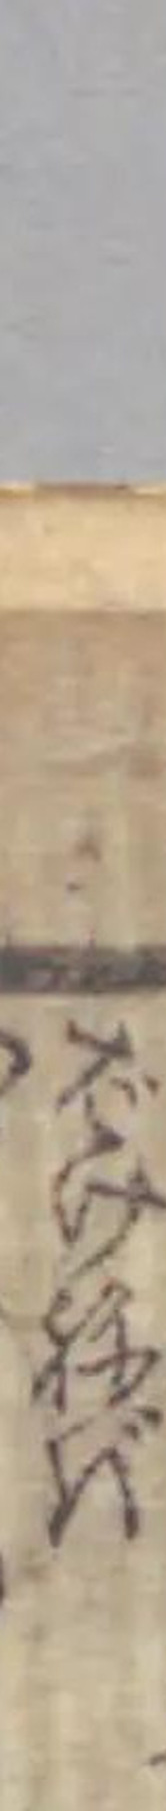ばけねば
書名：化物昼寝鼾 2巻
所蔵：国立国会図書館 National Diet Library, JAPAN
